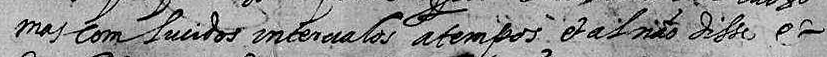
mas com lucidos interualos a tempos & al não disse &
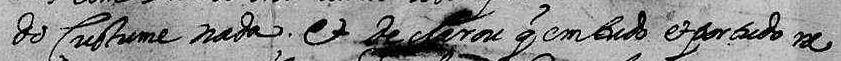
do Custume nada. & declarou q̄ em tudo & por tudo ra
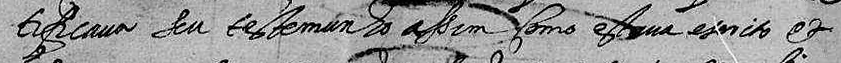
tificaua seu testemunho assim Como estaua escrito &
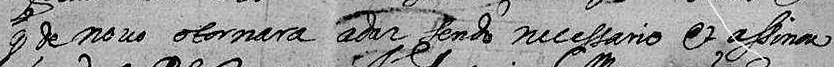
q̄ de nouo o tornara a dar sendo necessario & assinou
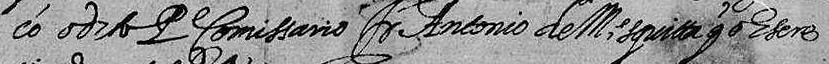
cō o dito Pe Comissario fr Antonio de Mesquitta q̄ o Escre
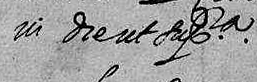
ui die ut supra.
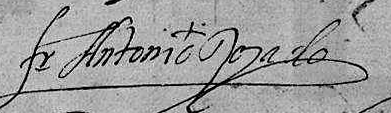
fr Antonio Rozado
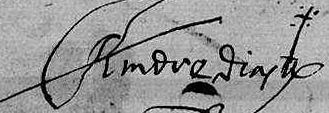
Andre dias
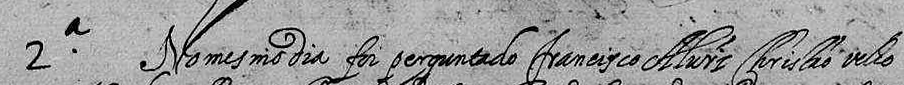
2a. No mesmo dia foi perguntado francisco Alurz̄ Christaõ velho
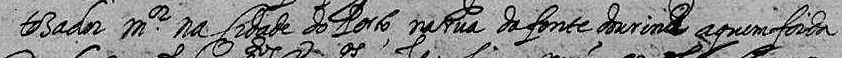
tozador mor na Cidade do Porto, na rua da fonte dourina a quem foi da
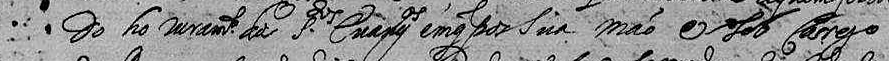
do ho iuram.to dos s.tos Euangos em q̄ pos sua maõ & sob Cargo
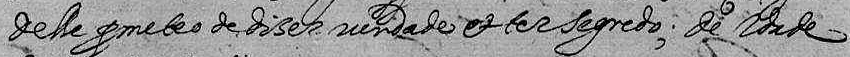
delle ꝓmeteo de dizer uerdade & ter segredo; de idade
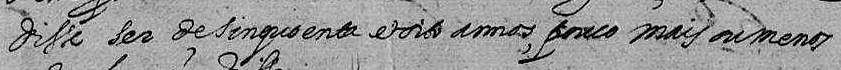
disse ser de sinquoenta & oito annos, pouco mais ou menos
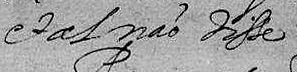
& al naõ disse
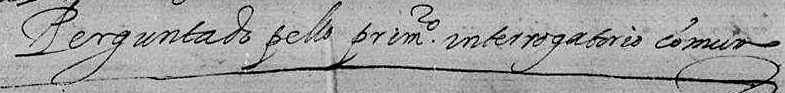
Perguntado pello prim.ro interrogatorio cōmum
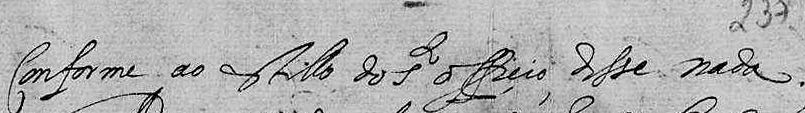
Conforme ao estillo do sto officio disse nada.
